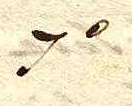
7o
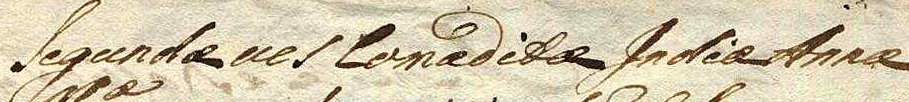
segunda ues Com a dita Jndia Anna
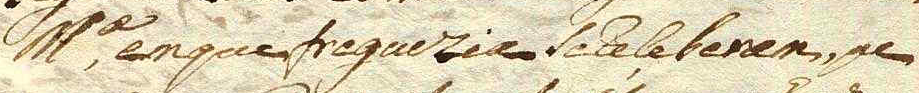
M.a, em que freguezia se ReCeberam, pe
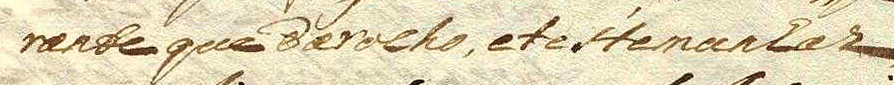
rante que Parocho, e testemunhaz
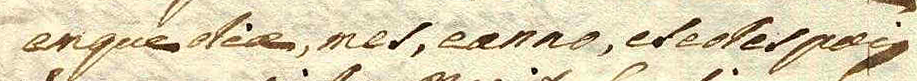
em que dia, mes, e anno, e se despois
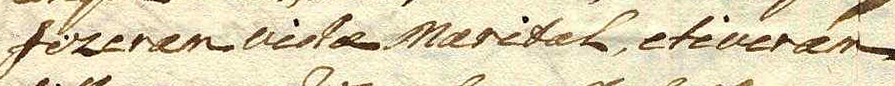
fizeram vida marital, e tiveram
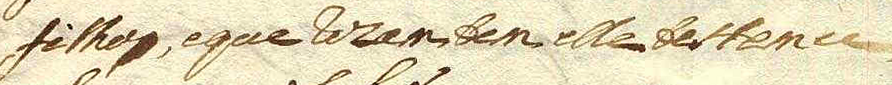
filhos, e que Rezam tem elle testemu
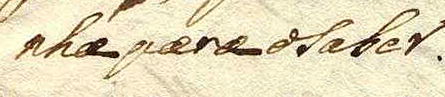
nha para o saber.
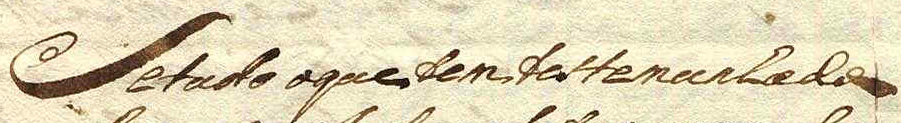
Se tudo o que tem testemunhado
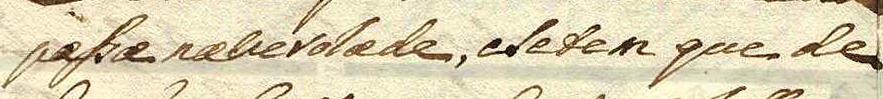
passa na verdade, e se tem que de
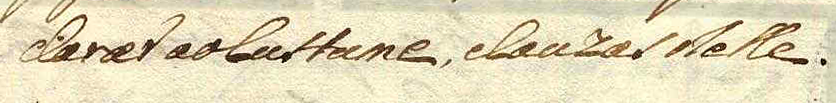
clarar ao Custume, e Couzas delle.
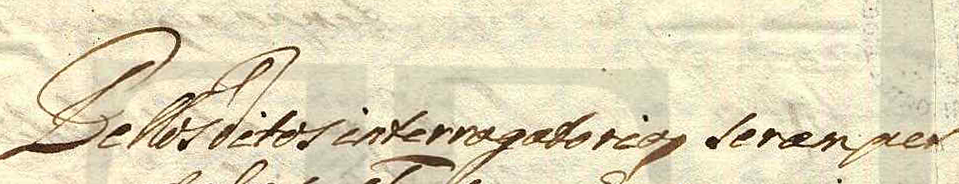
Pellos ditos interrogatorios seram per
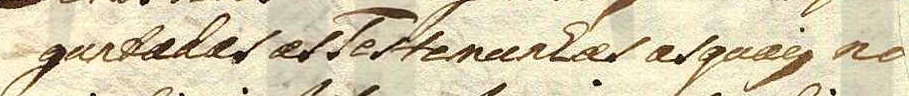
guntadas as testemunhas as quais no
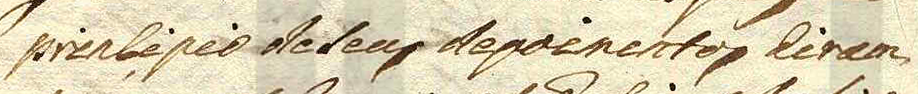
prinCipio de seus depoimentos diram
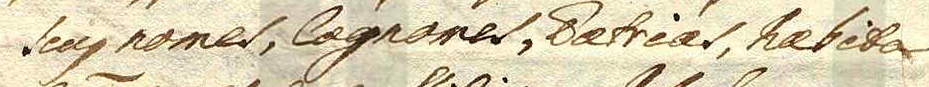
seus nomes, Cognomes, Patrias, habita
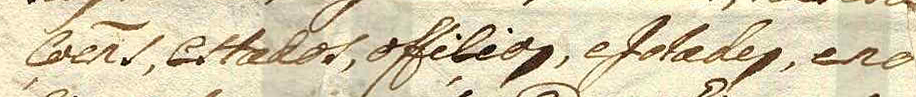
Çoen̄s, estados, offiCios, e Jdades, e no
